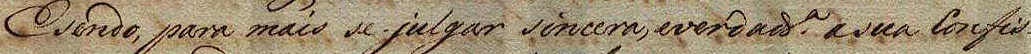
E sendo, para mais se-julgar sincera, e verdad.a a sua Confis
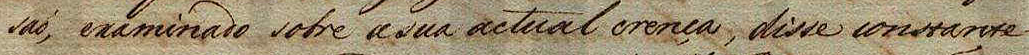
saõ, examinado sobre a sua actual crença, disse constante
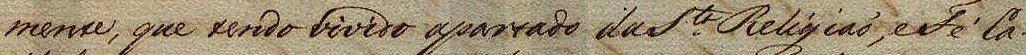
mente, que tendo vivido apartado da S.ta Religiaõ, e Fé Ca
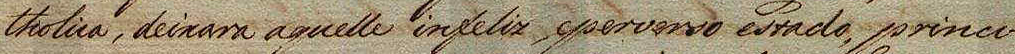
tholica, deixara aquelle infeliz, e perverso estado, princi
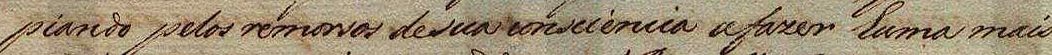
piando pelos remorsos de sua consciencia a fazer huma mais
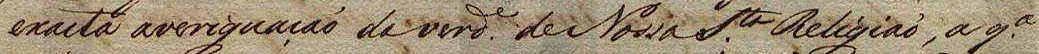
exacta averiguaçaõ de verd.e de Nossa S.ta Religiaõ, a q.al
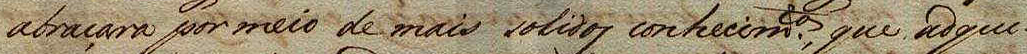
abraçara por meio de mais solidos conhecim.tos, que adqui
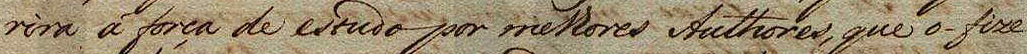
rira á força de estudo por melhores Authores, que o-fize
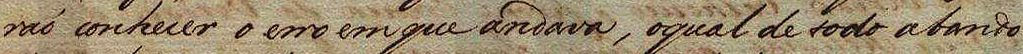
raõ conhecer o erro em que andava, o qual de todo abando
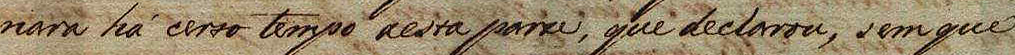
nara há certo tempo a esta parte, que declarou, sem que
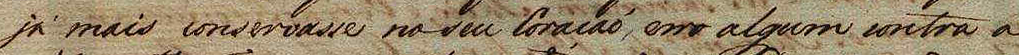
já mais conervasse no seu Coraçaõ, erro algum contra a
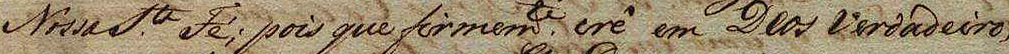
Nossa S.ta Fé; pois que firmem.te crê em Deos Verdadeiro,
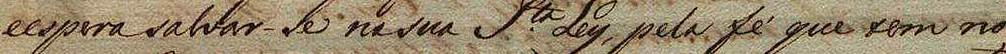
e espera salvar-se na sua S.ta Ley, pela fé que tem no
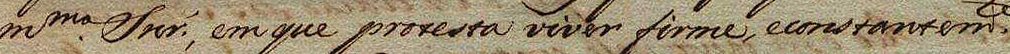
m.mo Snr., em que protesta viver firme, e constantem.te
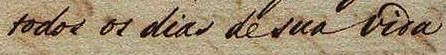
todos os dias de sua vida.
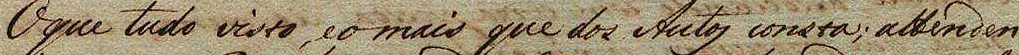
O que tudo visto, e o mais que dos Autos consta; attenden
